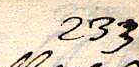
233
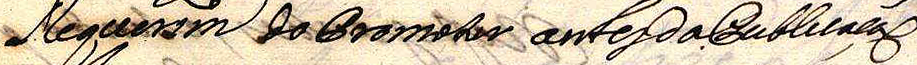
Requerimto do Promotor antes da Publicaçaõ
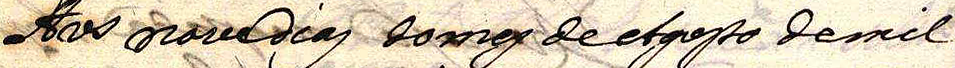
Aos nove dias do mes de Agosto de mil
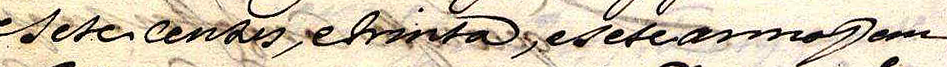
e setecentos, e trinta, e sete annos em
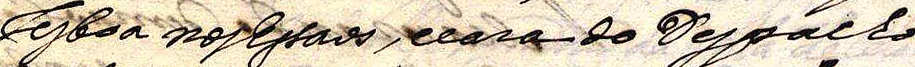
Lisboa nos Estaos, e caza do Despacho
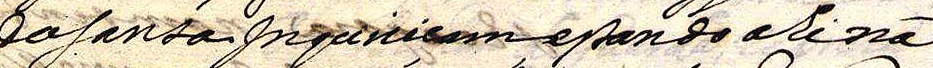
da santa Jnquiziçam, estando ahi na
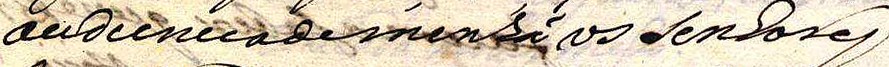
audiencia de menhã os senhores
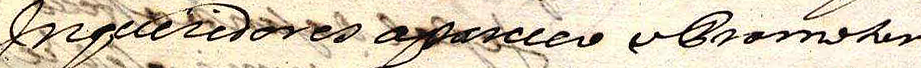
Jnquizidores apareceo o Promotor
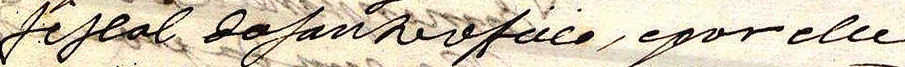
fiscal do santo officio, e por elle
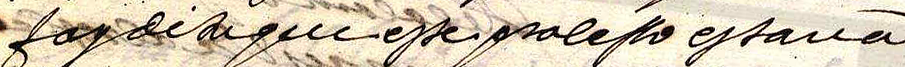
foy dito que este processo estava
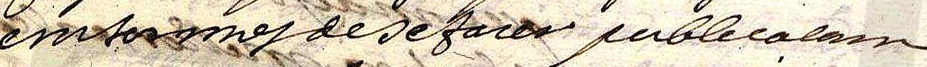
em termos de se fazer publicaçam
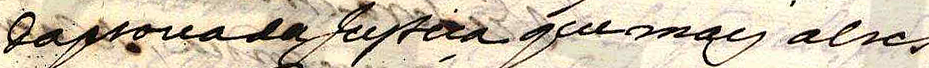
da proua da Justiça que mais acres
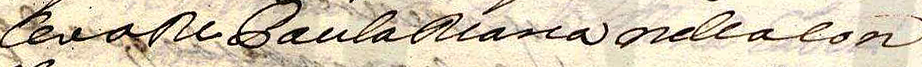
ceo a Re Paula Maria nella con
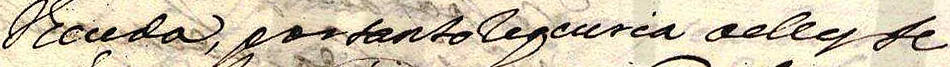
theuda, portanto Requeria a elles se
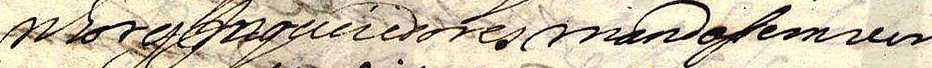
nhores Jnquizidores mandassem vir
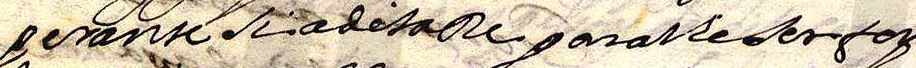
perante si a dita Re para lhe ser fey
